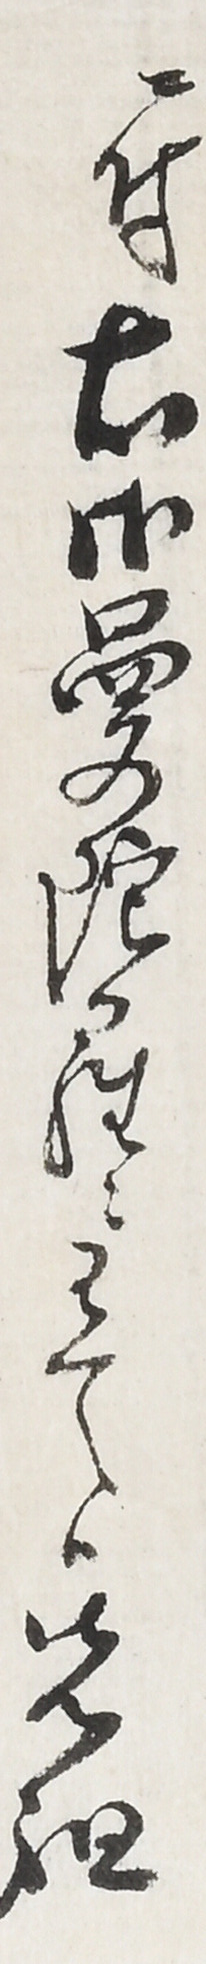ニ付右御曼陀羅ニ有之候先祖
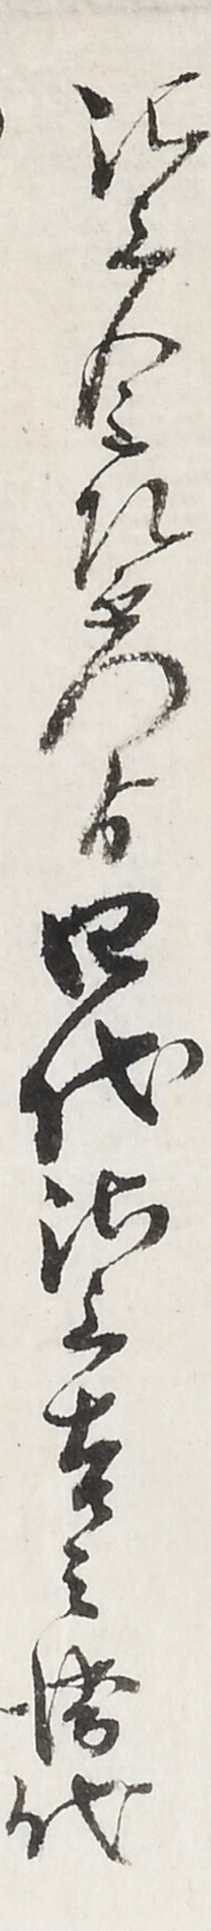池上金左衛門ゟ四代池上吉兵衛代
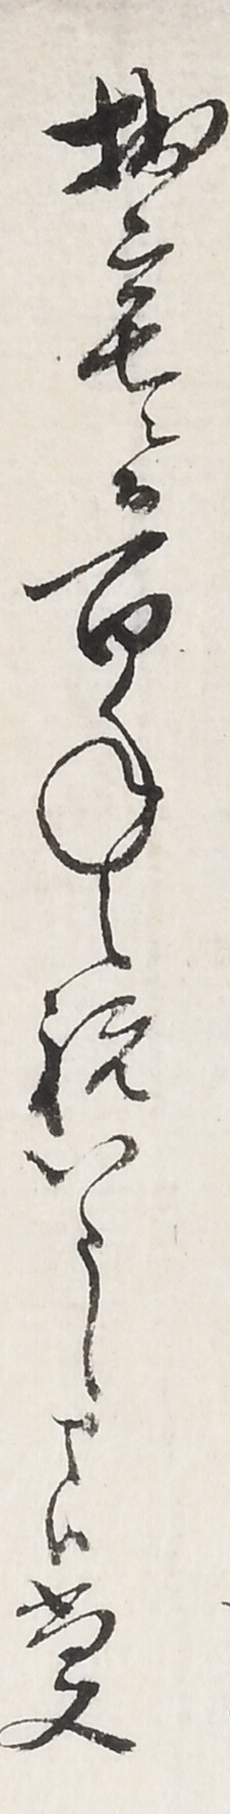拙宅ニ而百年之祝いたし申候尚又
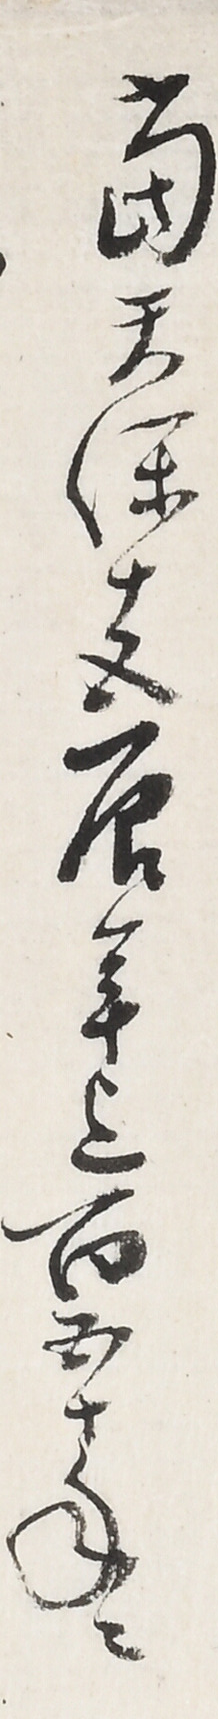当天保十五辰年迄百五十年ニ
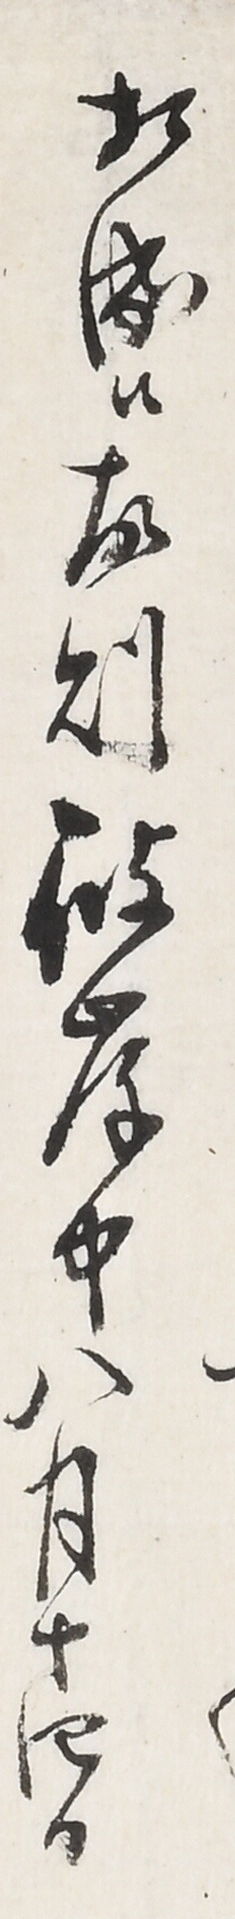相成候故則彼岸中八月十四日
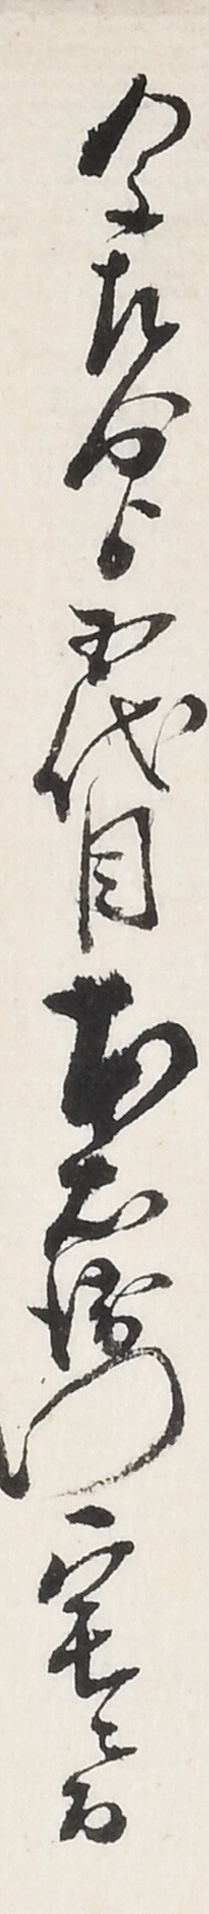同左衛門ゟ五代目本右衛門宅ニ而
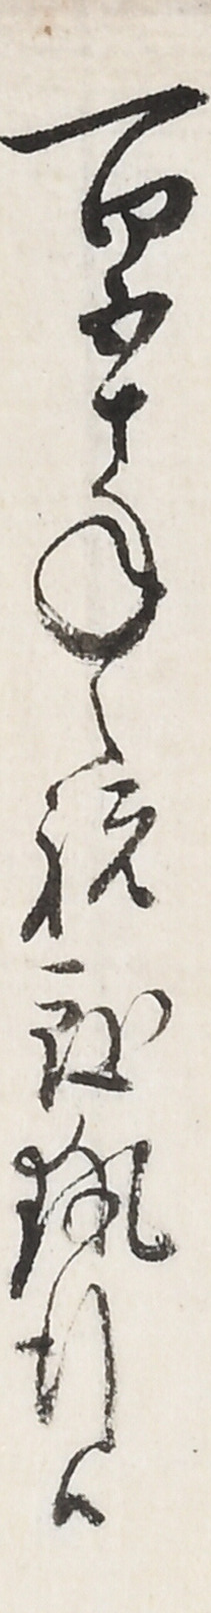百五十年之祝致執行候
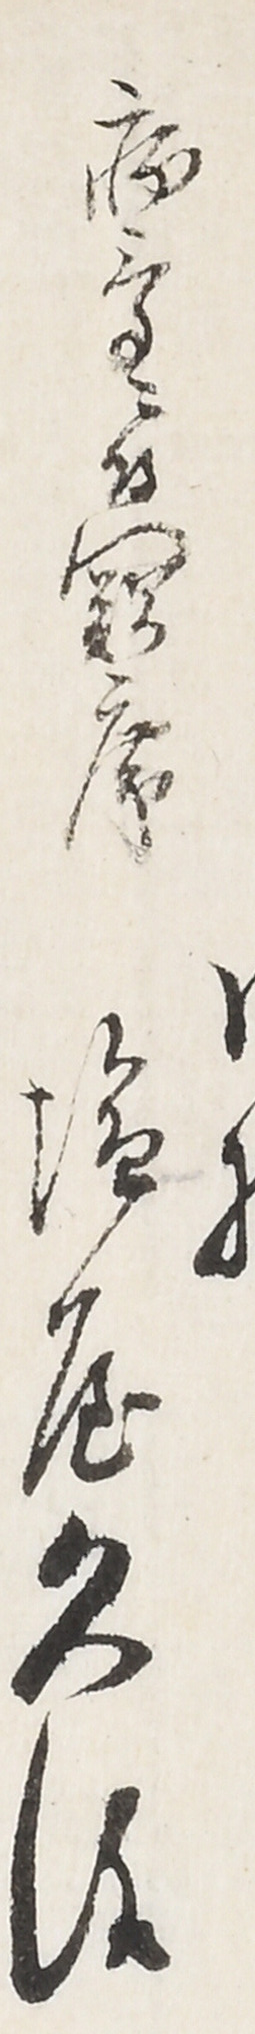病気ニ付欠席塩屋久治
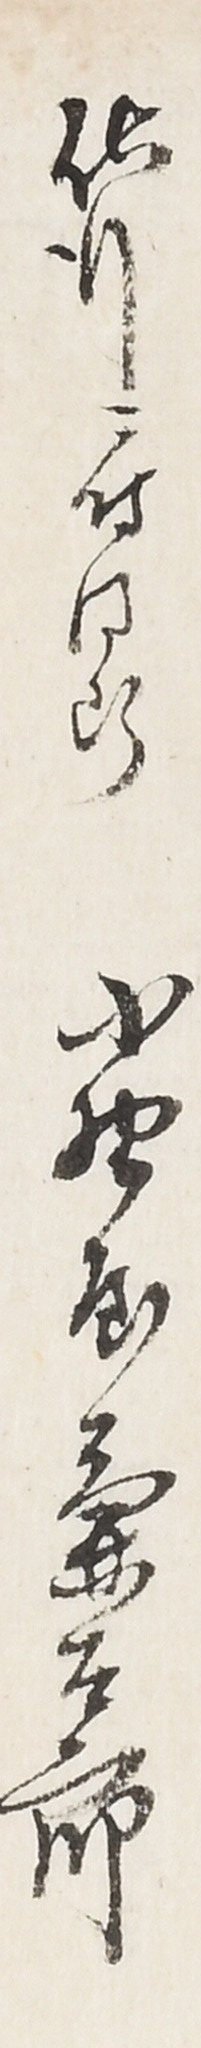佐行ニ付同断小野屋兼太郎
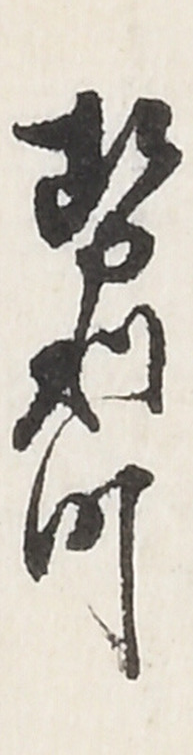勢利町
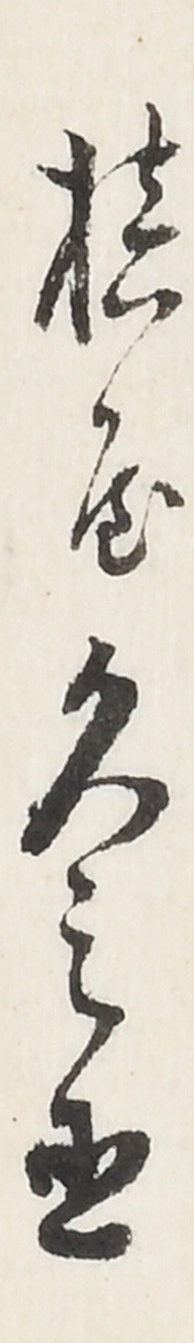槙屋久之丞
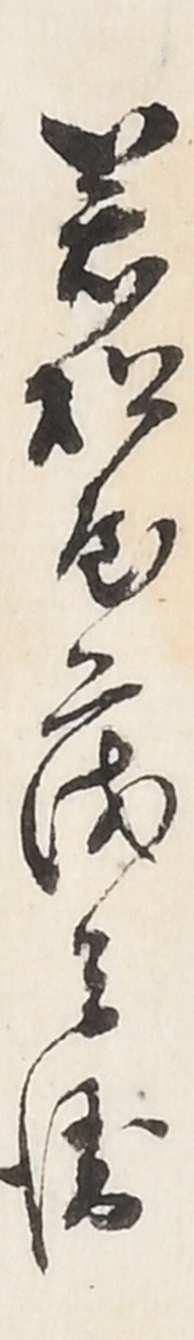若松屋茂兵衛
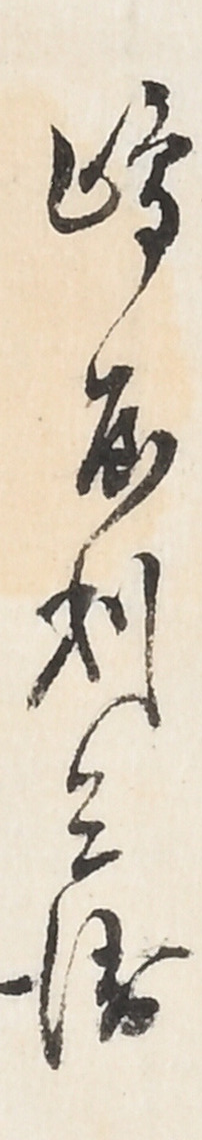嶋屋利兵衛
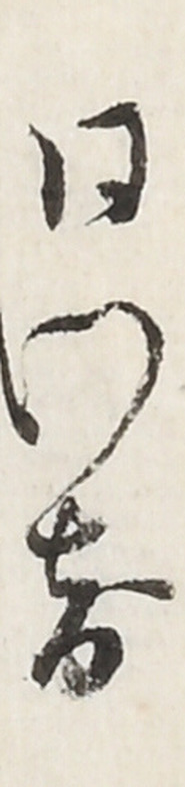同門前
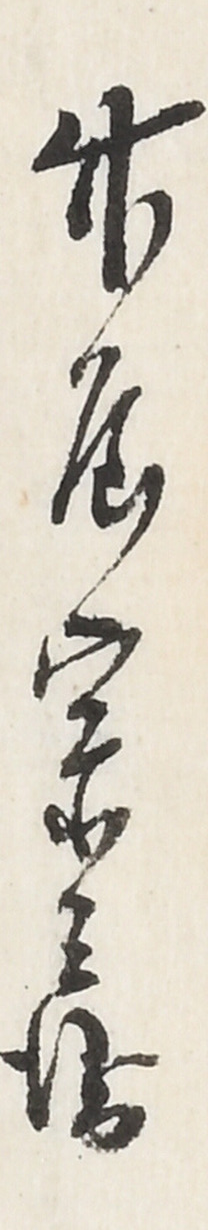竹屋宗兵衛
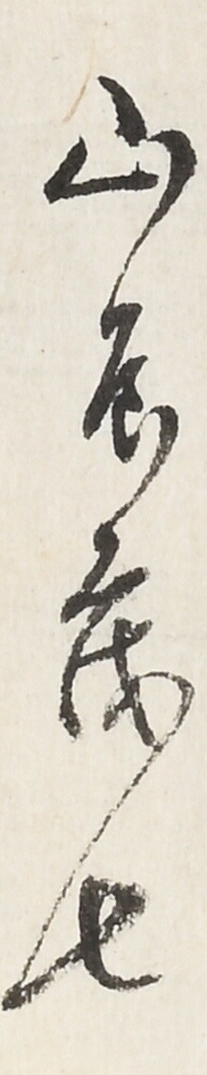山屋茂七
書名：従元禄八亥年天保十五甲辰年迄題目講百五十年相續之祝
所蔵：伊那市立高遠町図書館・合同会社AMANE
